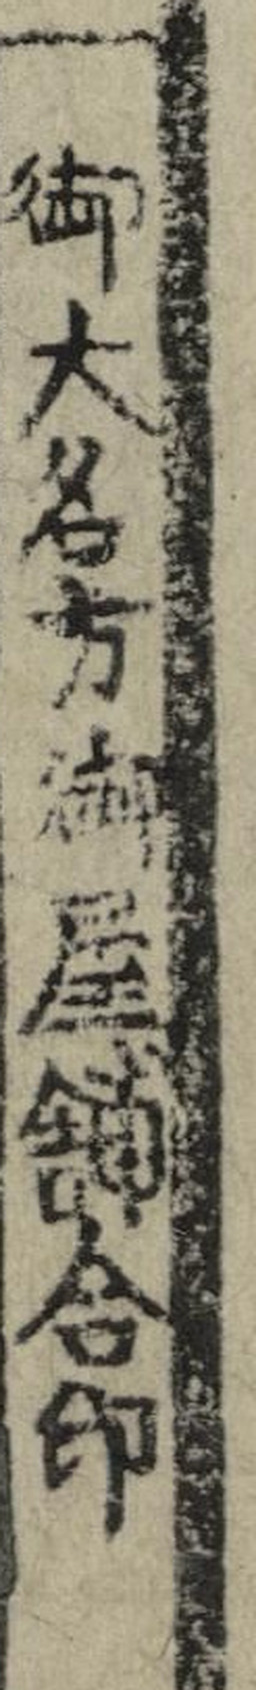御大名方御屋舗合印
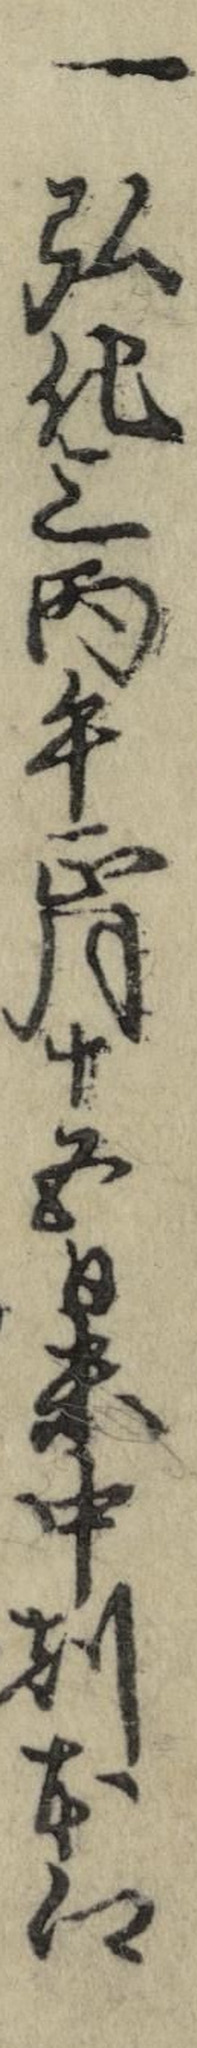一弘化三丙午正月十五日未中刻本郷
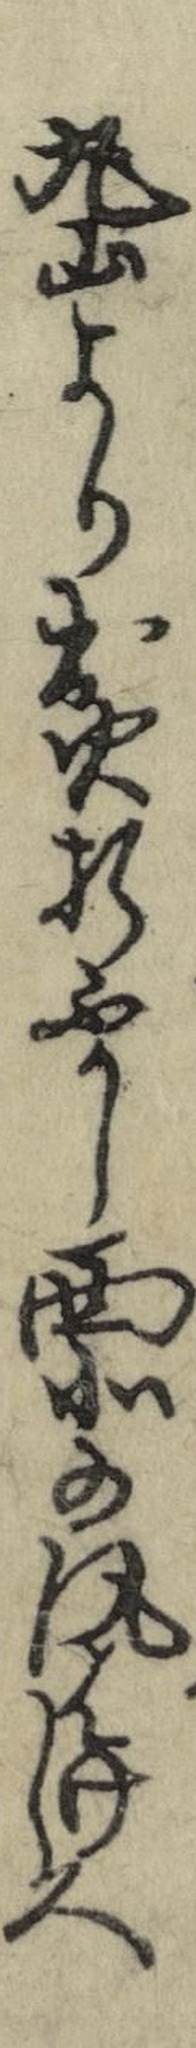丸山より出火折ふし西北の風はけしく
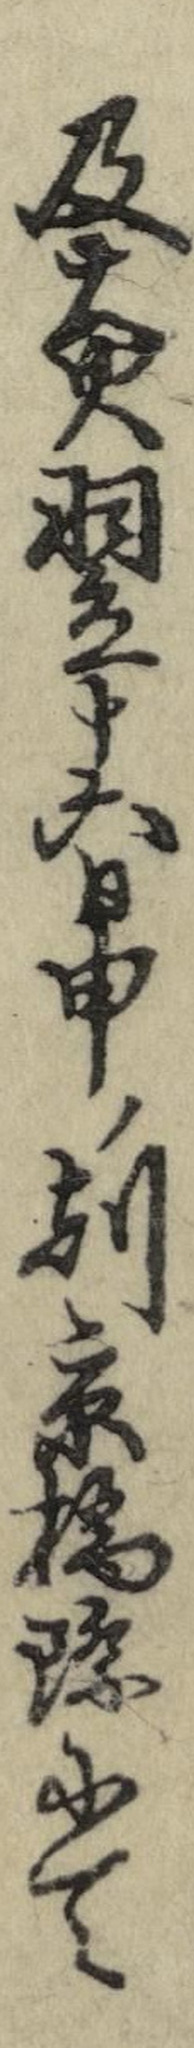及大火翌十六日申ノ刻京橋際にて
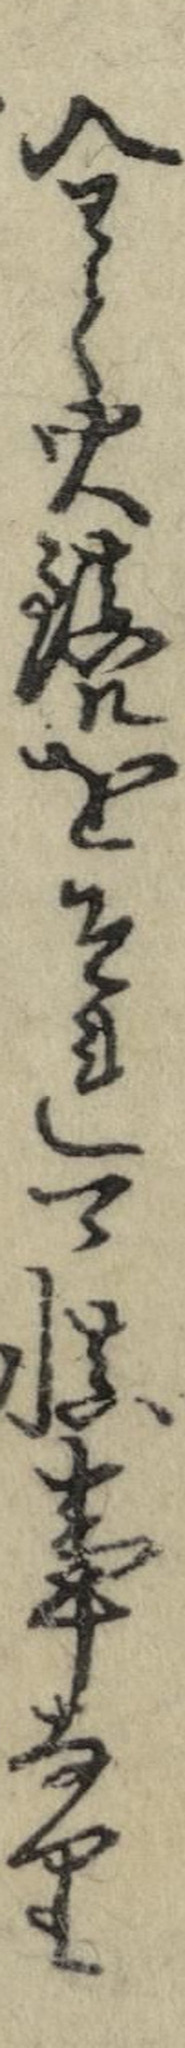全く火鎮ルをそれ可慎事なり
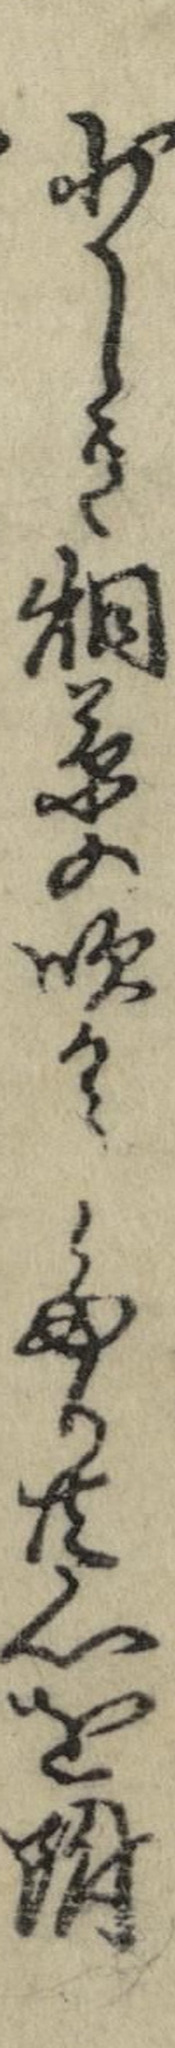少しき烟草の吹くたり共心を附
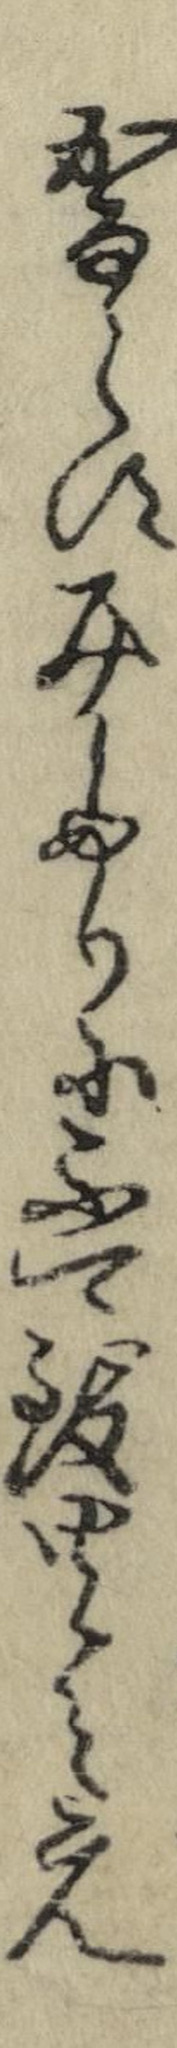かならすみたりに不可致火之元
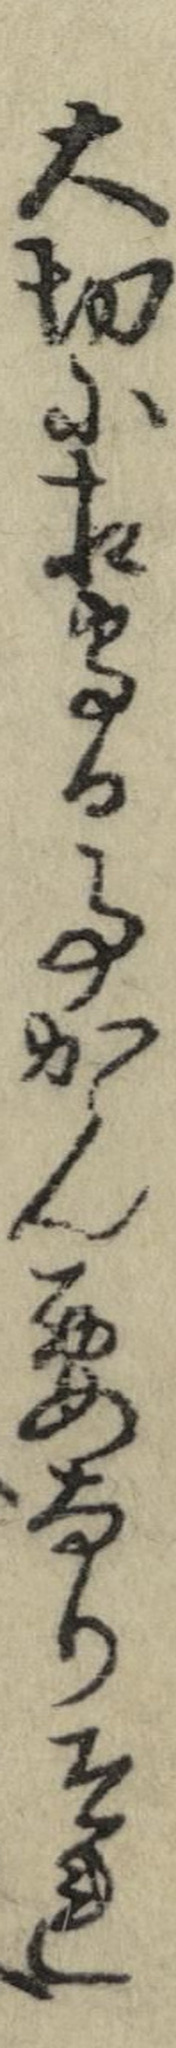大切に相守る事かん要なりそれ
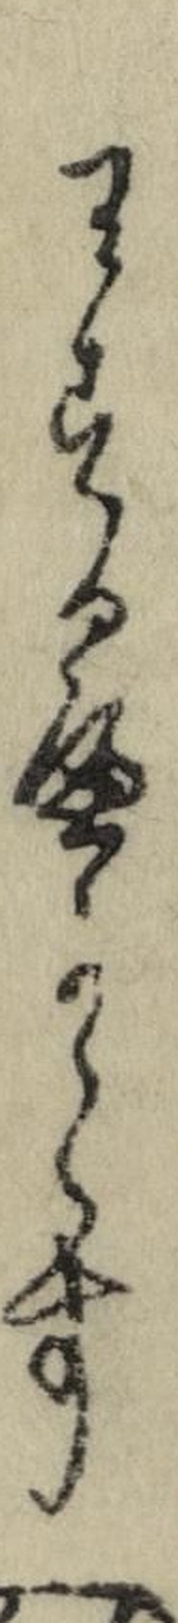わするべからす
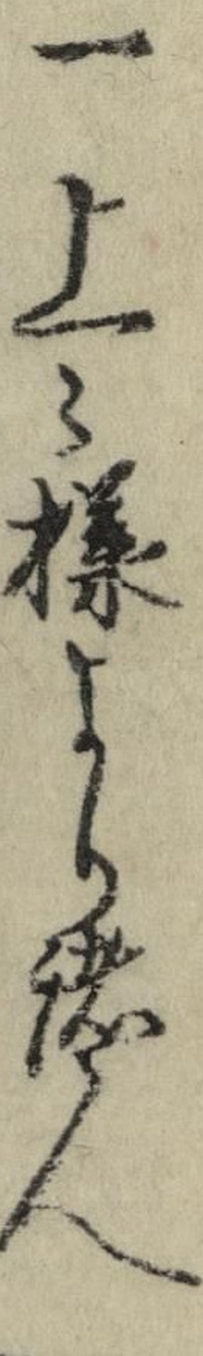一上〻様より諸人
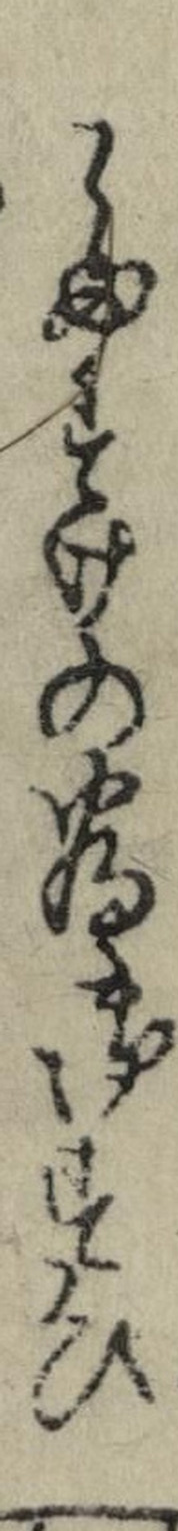たすけの為御すくひ
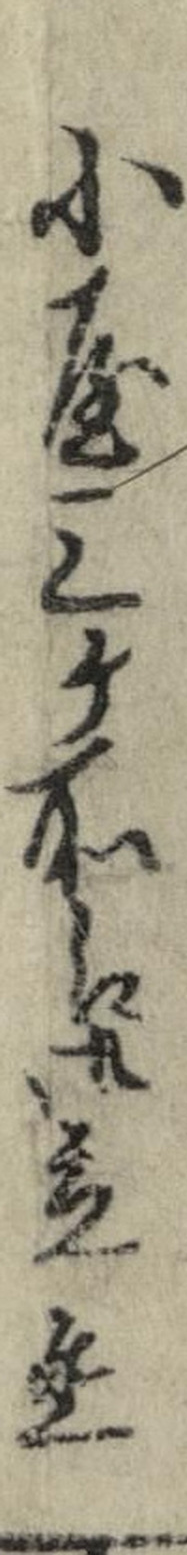小屋三ケ所江御立置
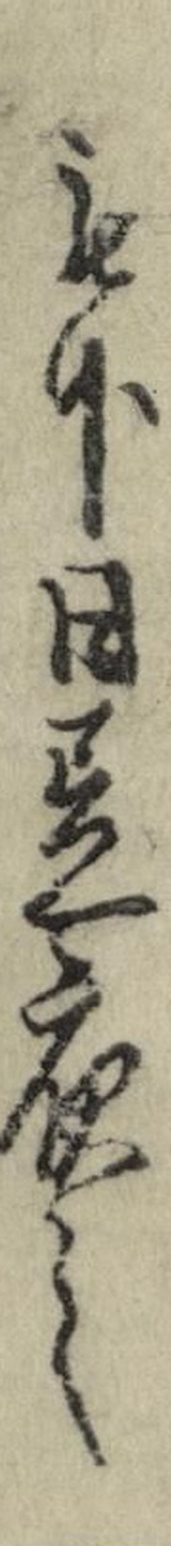被下日昼夜之
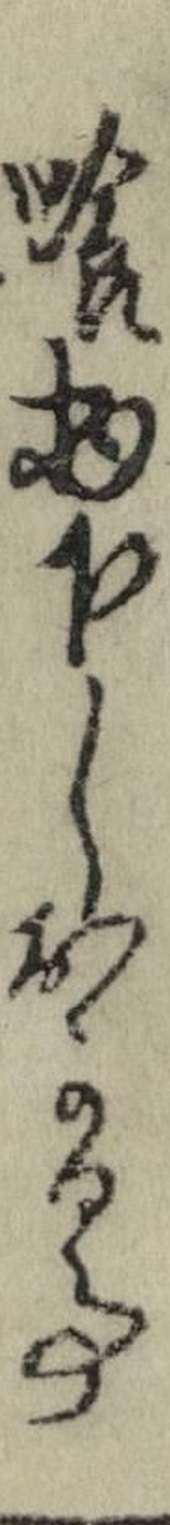喰物下しおかる事
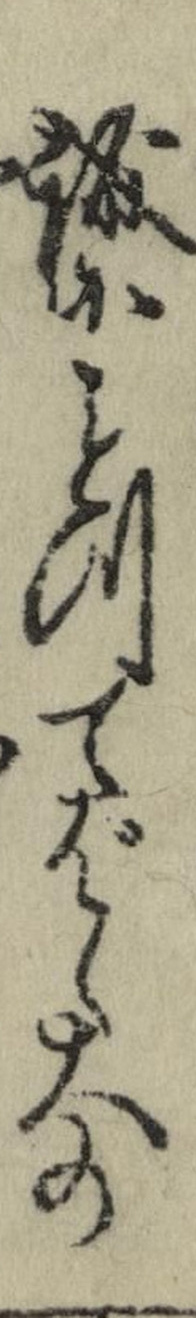誠にもつてばく大の
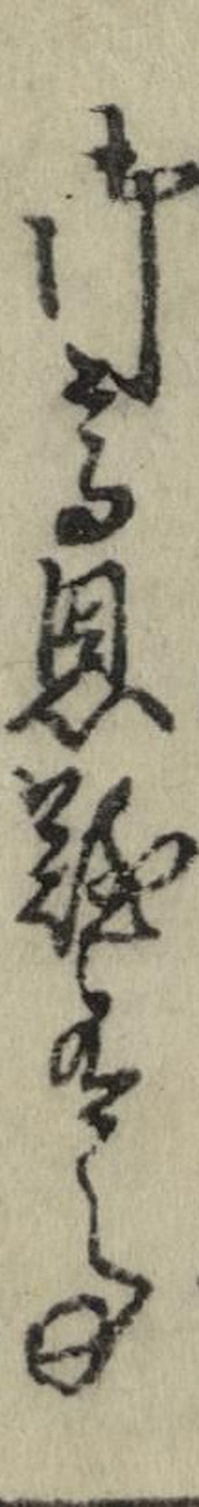御高恩難有事
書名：[弘化三年一月の江戸大火に関する瓦版]
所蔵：東京大学地震研究所図書室 Earthquake Research Institute Library, The University of Tokyo, JAPAN
